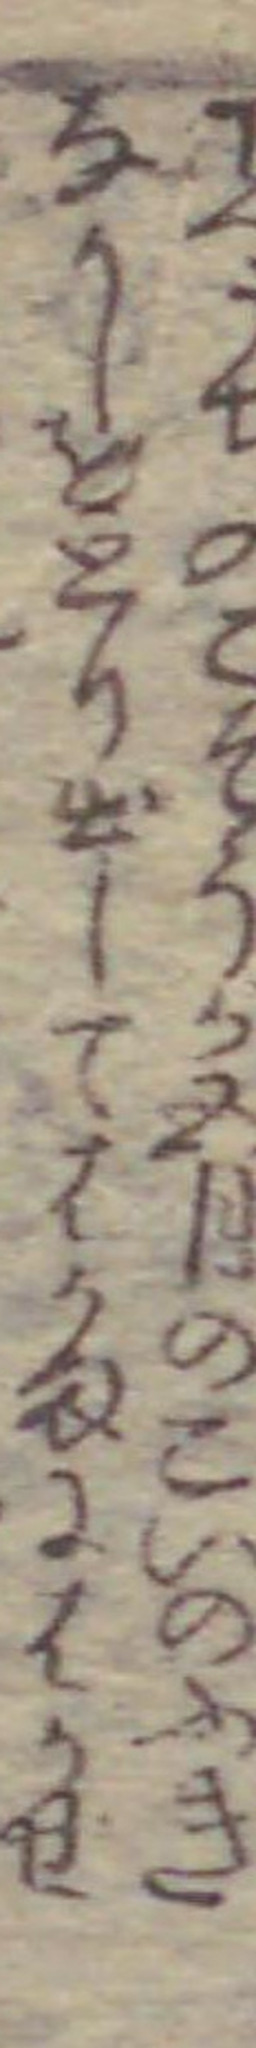なかしをとり出してはかまにはかせ
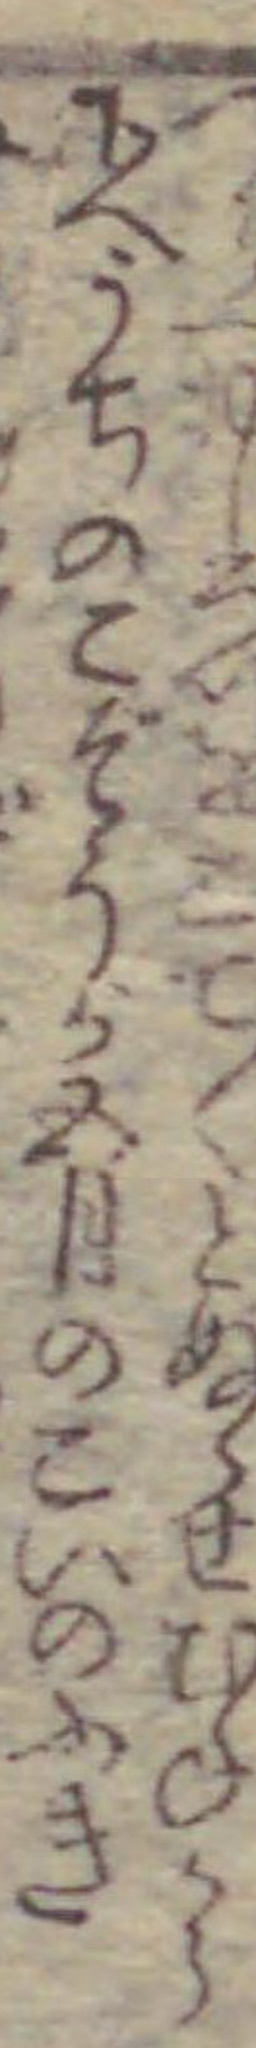下へうちのこぞうが五月のこいのふき
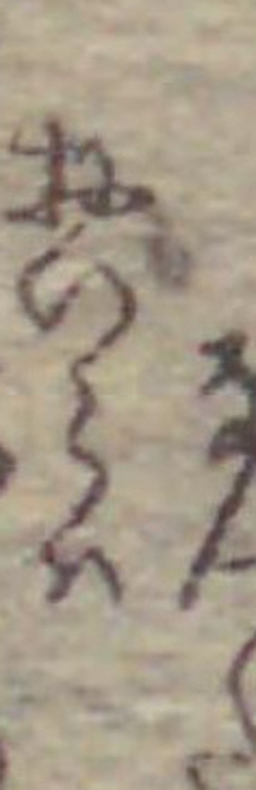おいらは
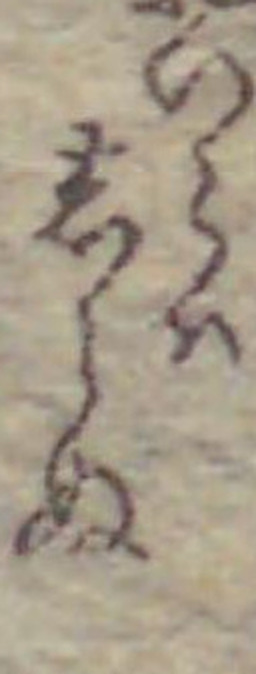しらぬ
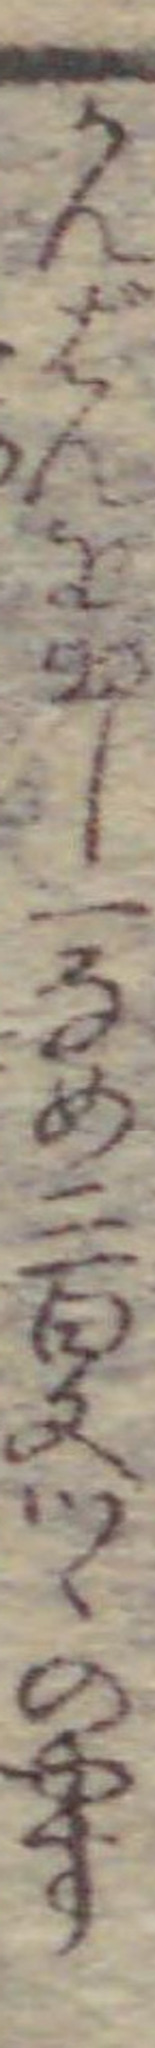かんばんを出し一なめ二百文つゝのやす
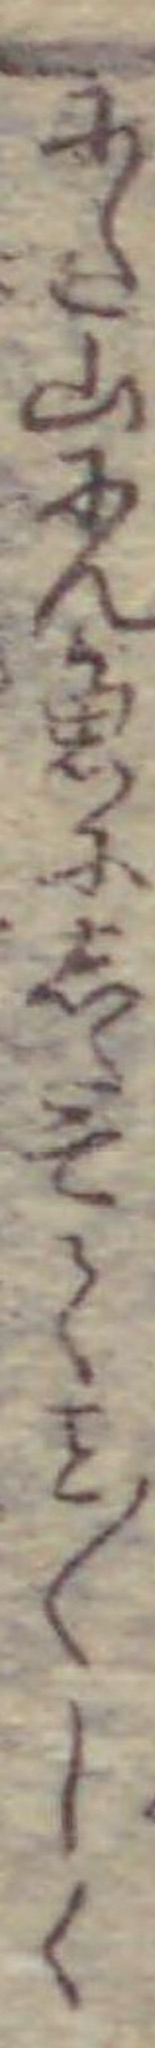にた山にん魚にしたててこと〳〵しく
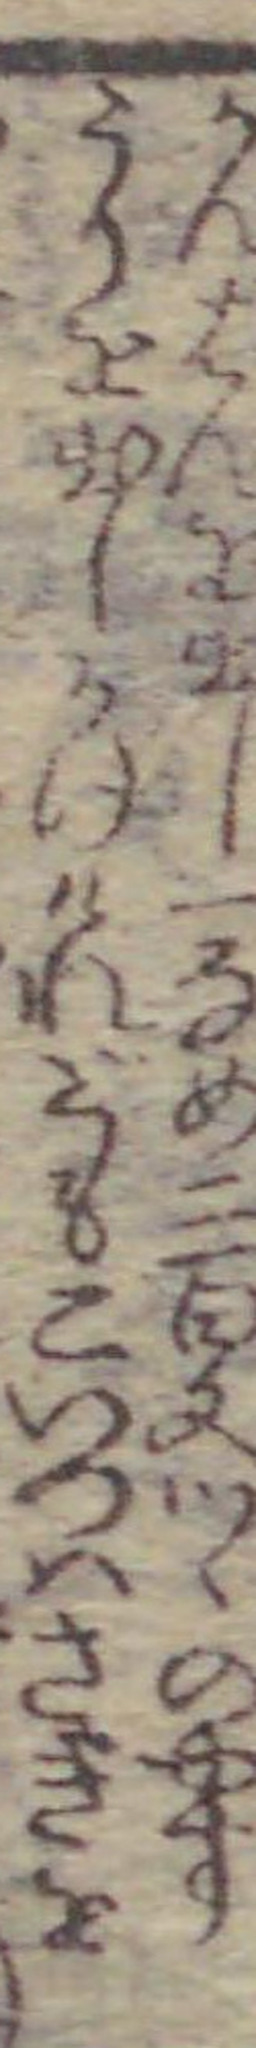うりを出しかけれどもこいつはさぎを
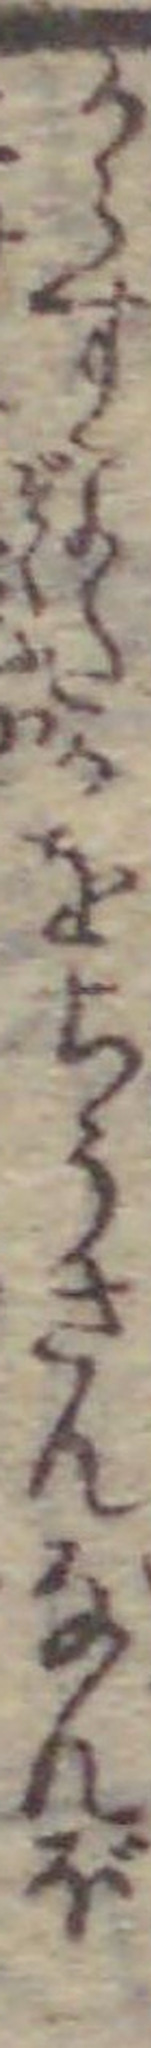からすにたかをちうさんなんぼ
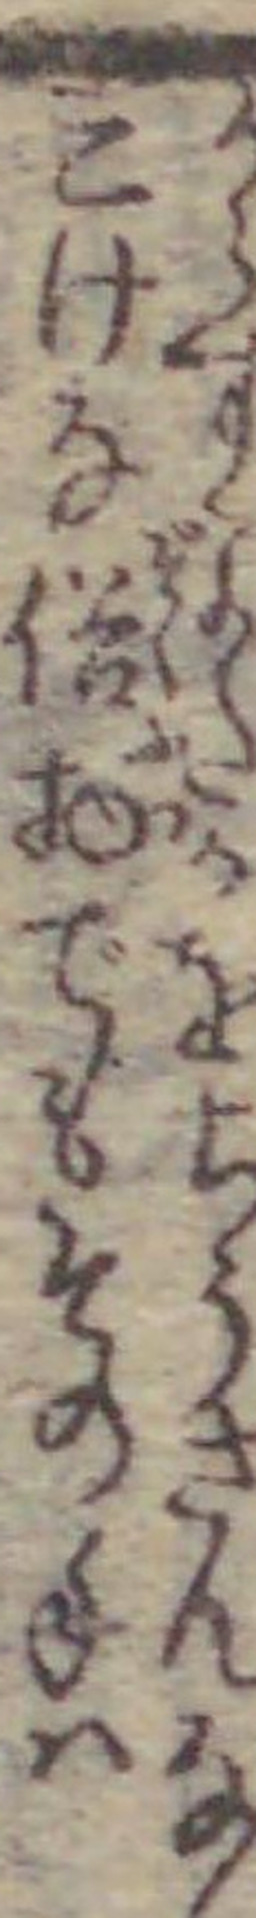こけな俗物でもその手は
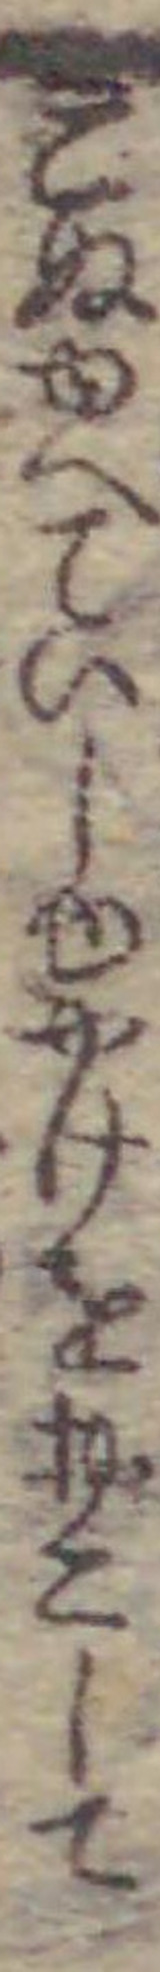こぬゆへていしゆやけをおこして
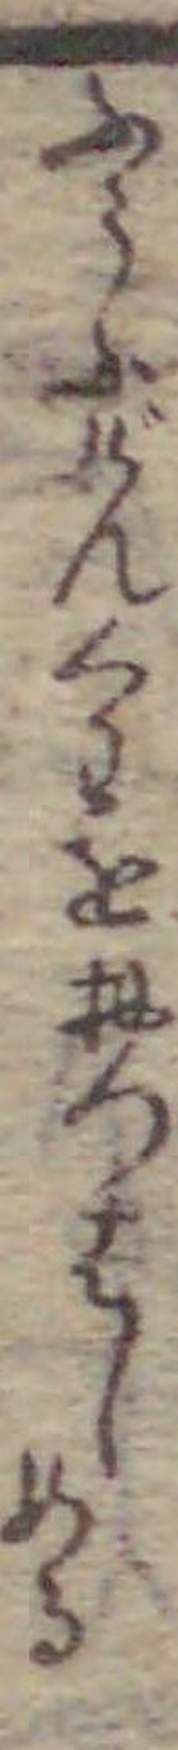ふうふげんくわをおつはしめる

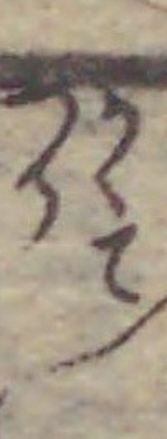かくて
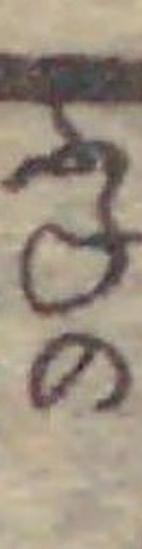ふねの
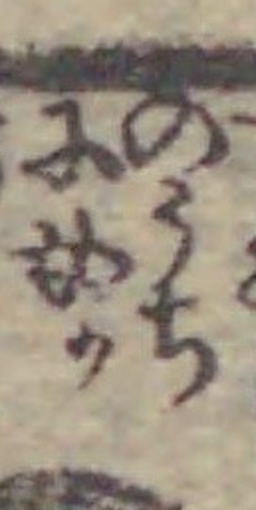に女う
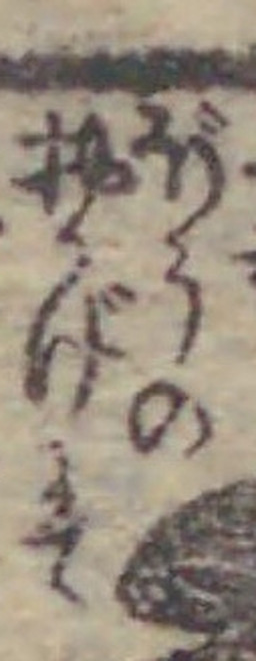おかげにて
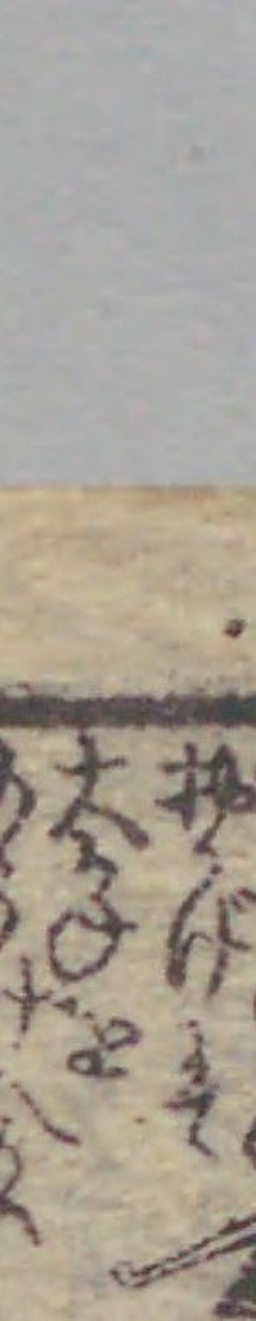大かねを
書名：箱入娘面屋人魚 3巻
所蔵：国立国会図書館 National Diet Library, JAPAN
